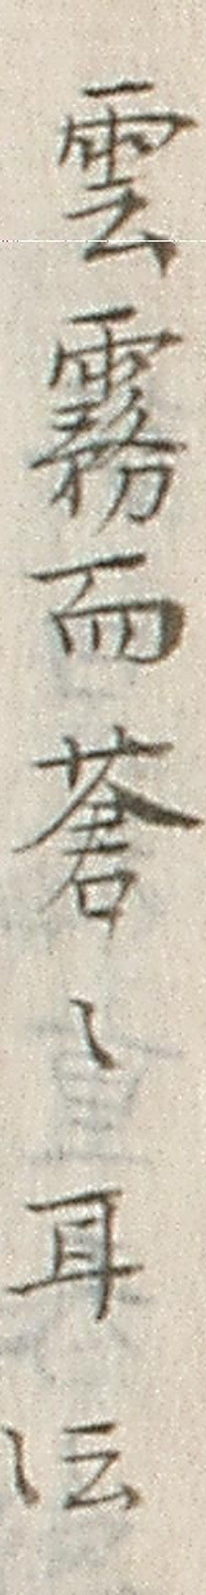雲霧而蒼〻耳云〻

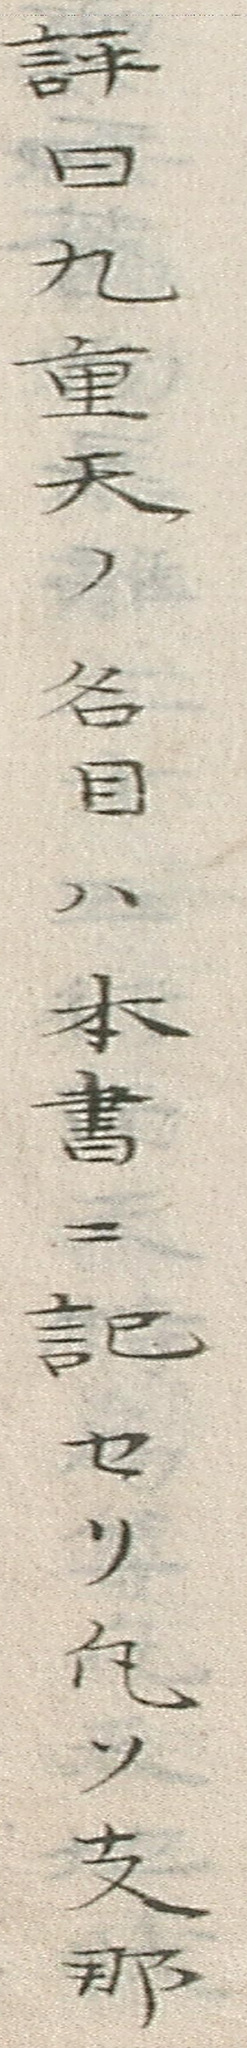評曰九重天ノ名目ハ本書ニ記セリ凡ソ支那
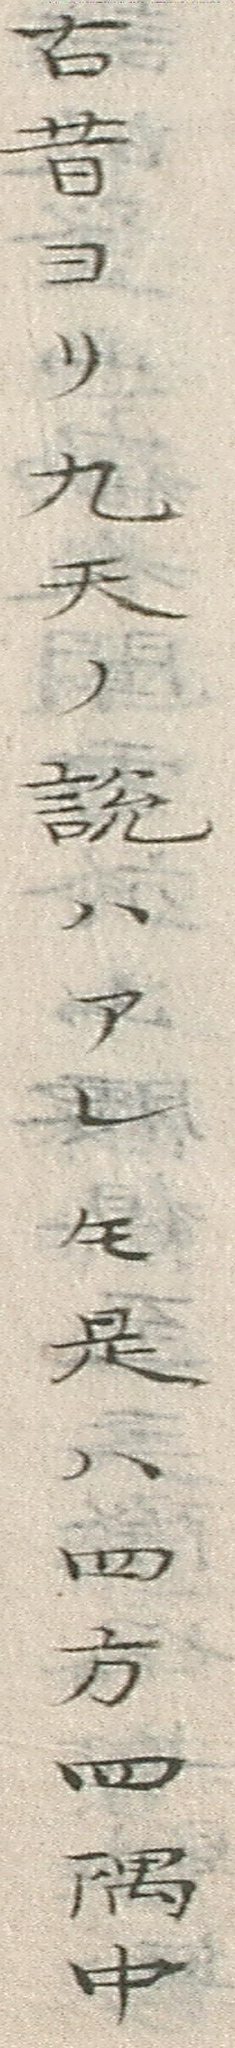古昔ヨリ九天ノ説ハアレトモ是ハ四方四隅中
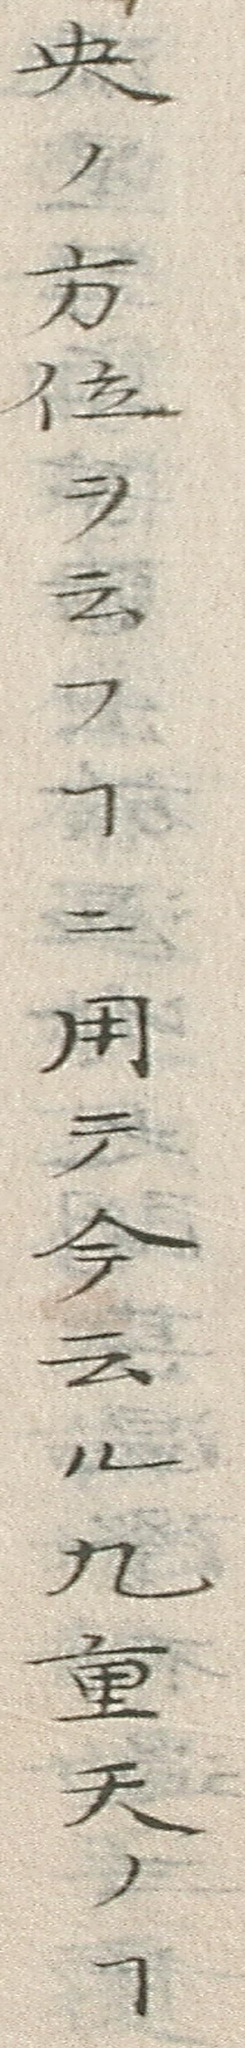央ノ方位ヲ云フコトニ用テ今云ル九重天ノコト
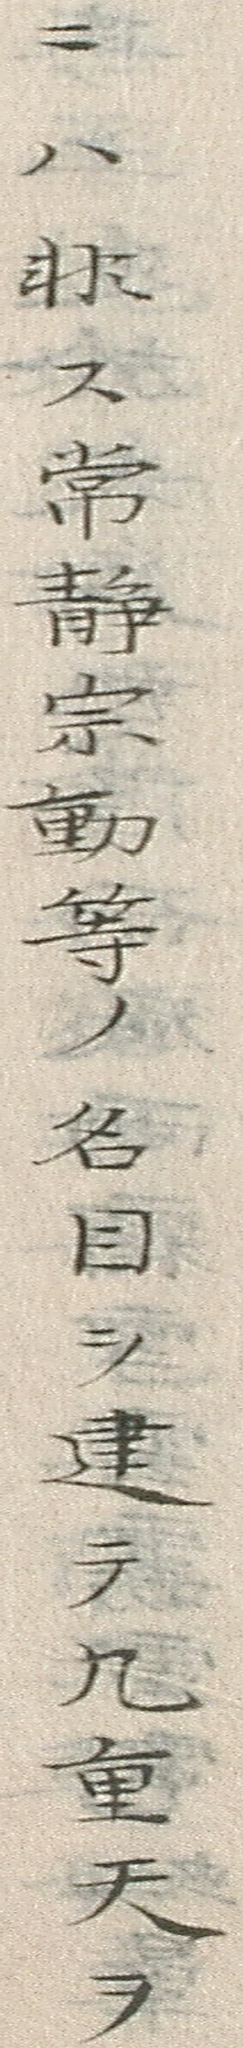ニハ非ス常静宗動等ノ名目ヲ建テ九重天ヲ
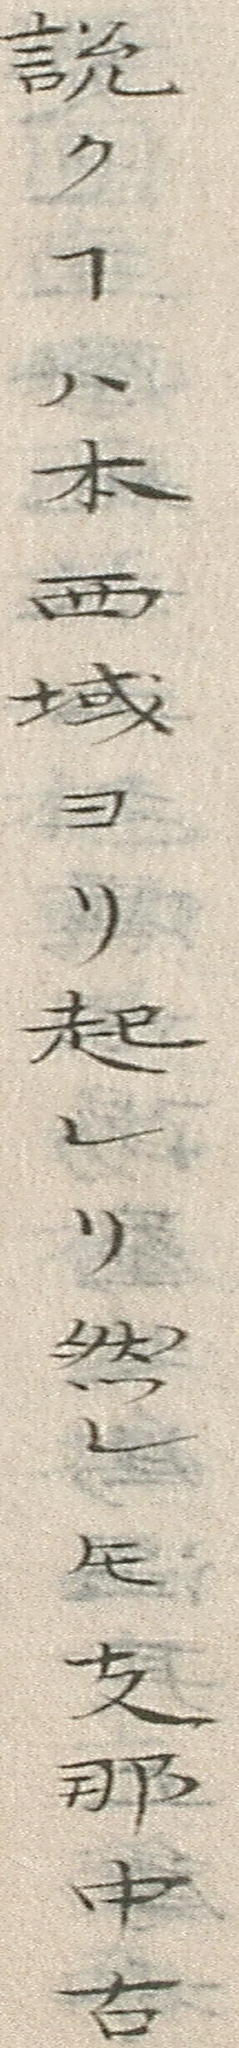説クコトハ本西域ヨリ起レリ然レトモ支那中古
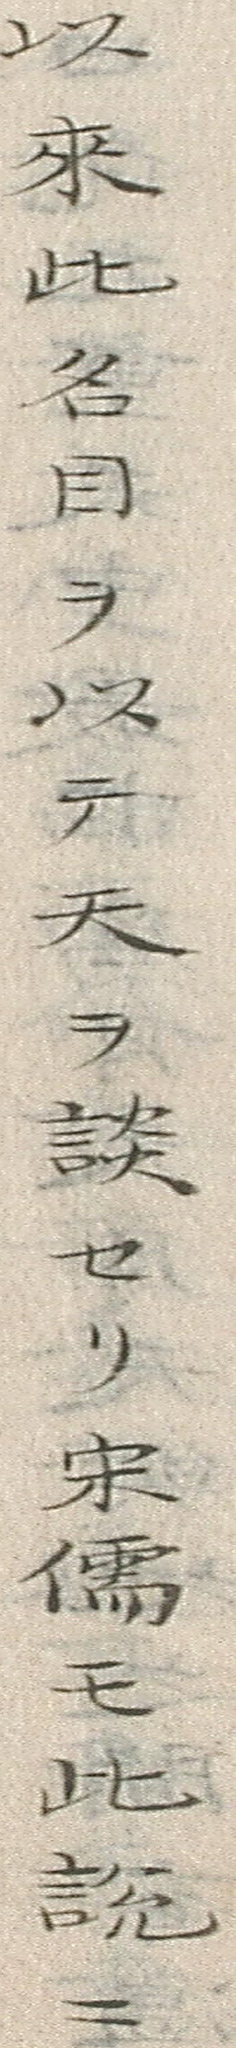以来此名目ヲ以テ天ヲ談セリ宋儒モ此説ニ
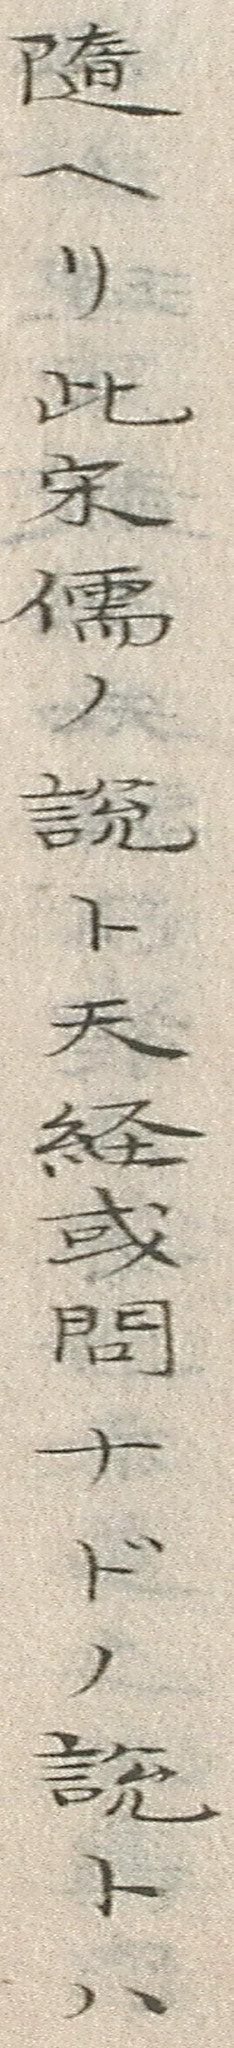随ヘリ此宋儒ノ説ト天経或問ナドノ説トハ
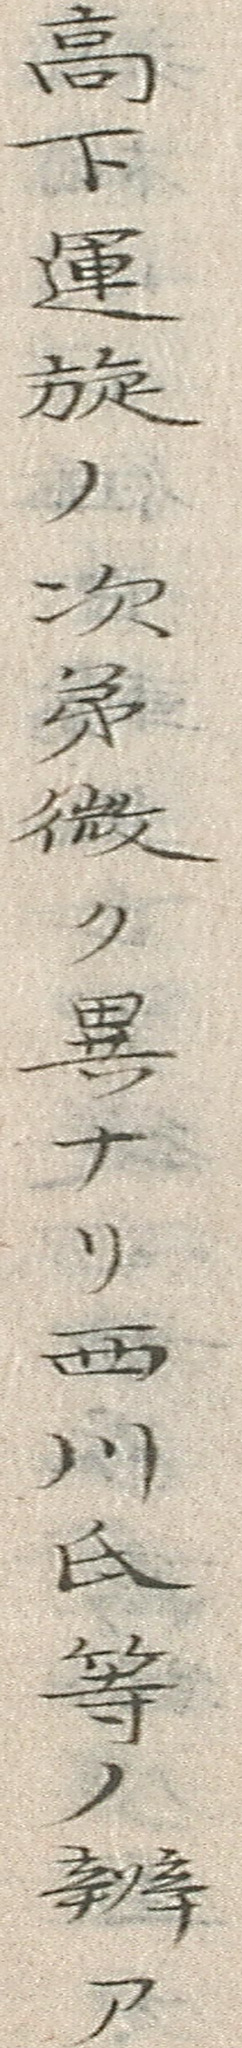高下運旋ノ次第微ク異ナリ西川氏等ノ弁ア
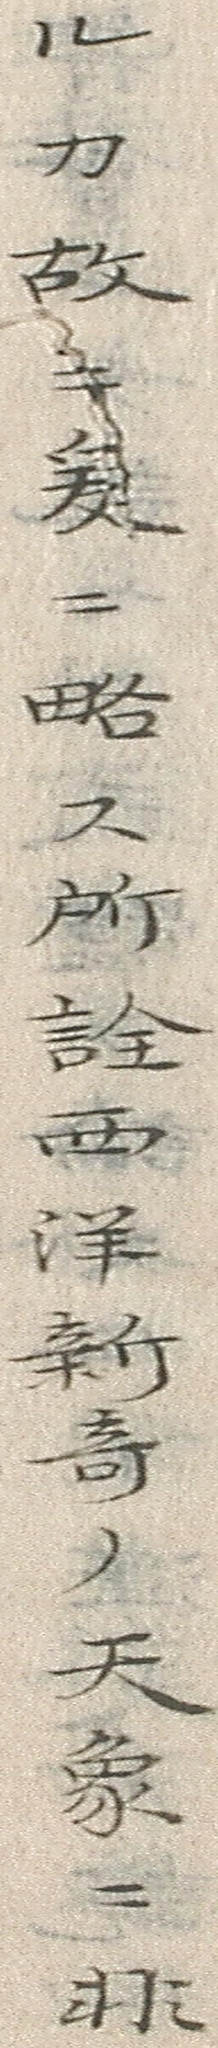ルカ故ニ爰ニ略ス所詮西洋新奇ノ天象ニ非
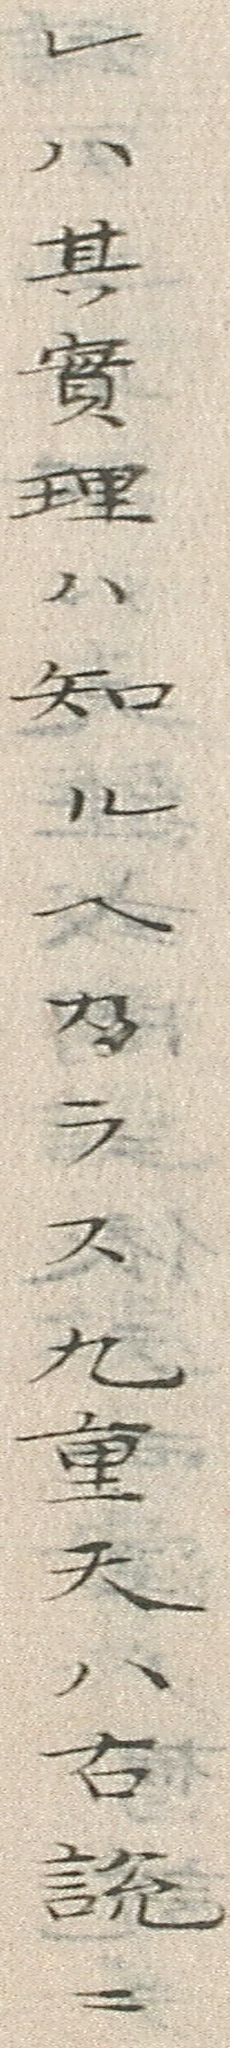レハ其実理ハ知ルヘカラス九重天ハ古説ニ
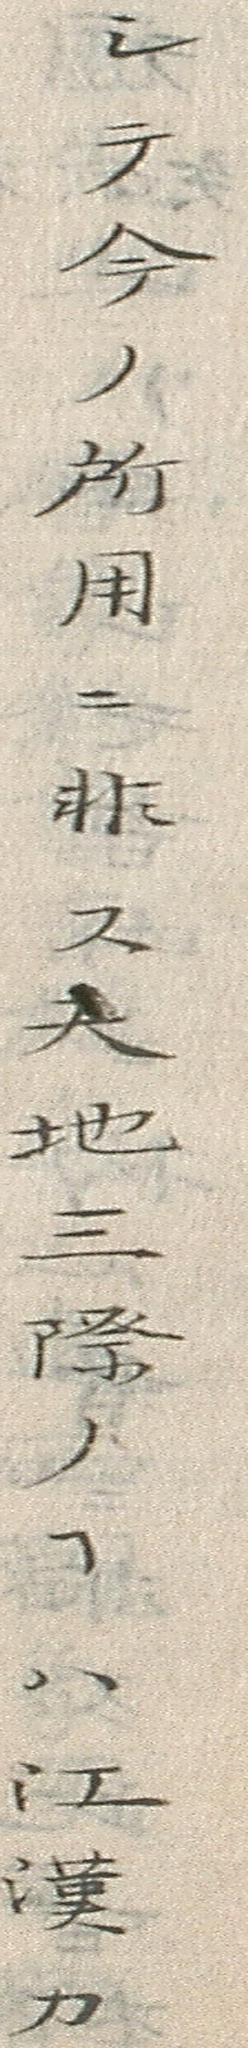シテ今ノ所用ニ非ス天地三際ノコトハ江漢カ
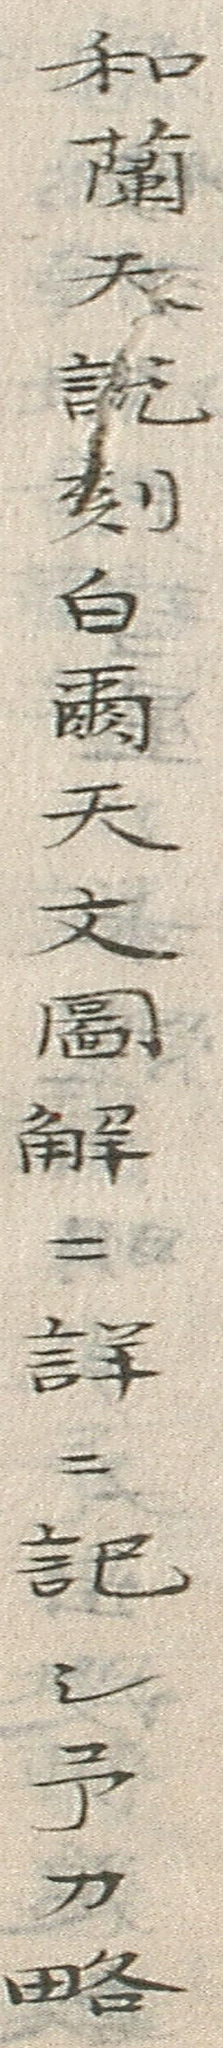和蘭天説刻白爾天文図解ニ詳ニ記シ予カ略
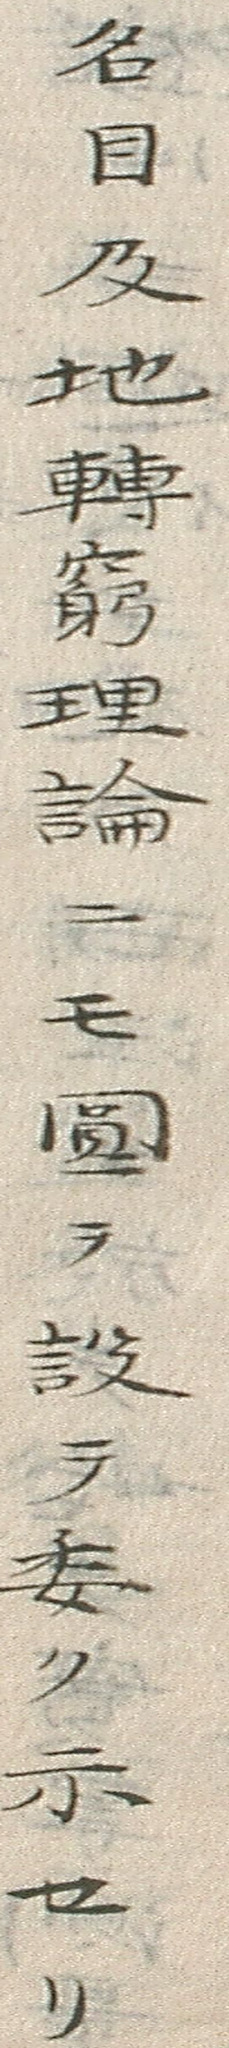名目及地転窮理論ニモ円ヲ設テ委ク示セリ
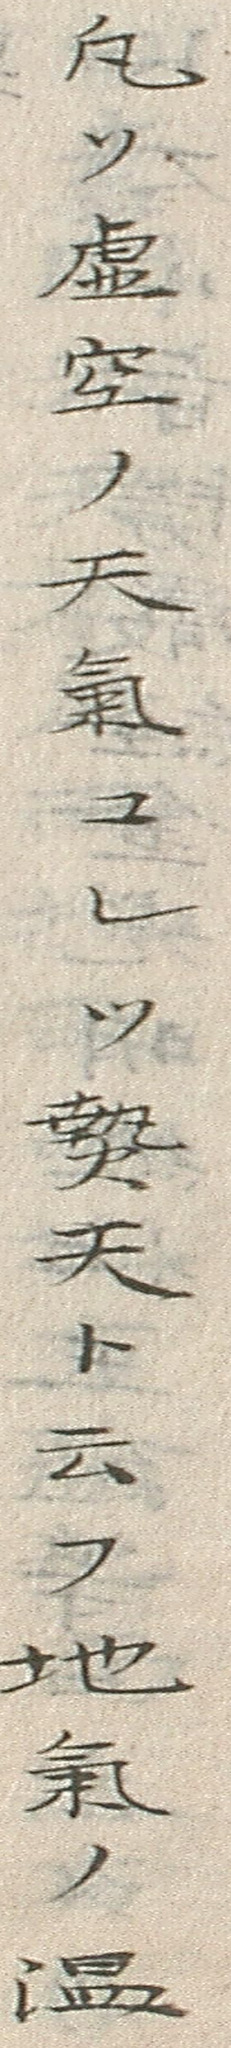凡ソ虚空ノ天気ユレツ熱天ト云フ地気ノ温
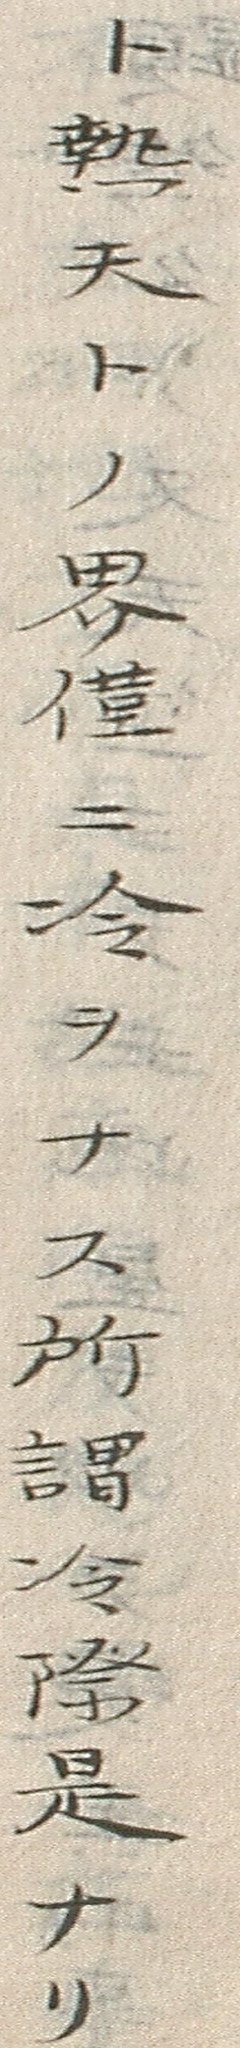ト熱天トノ界僅ニ冷ヲナス所謂冷際是ナリ
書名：天學略名目羽翼　全
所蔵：東京大学地震研究所図書室 Earthquake Research Institute Library, The University of Tokyo, JAPAN
